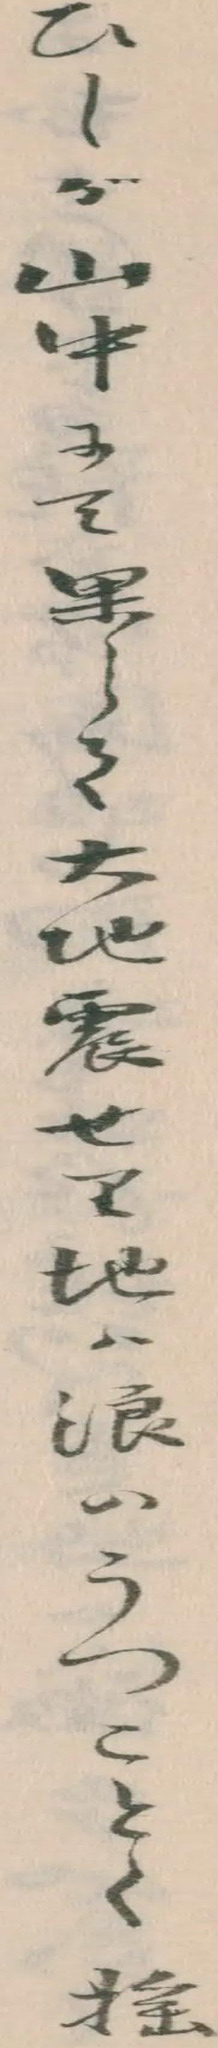ひしが山中にて果して大地震せり地は浪のうつことく揺
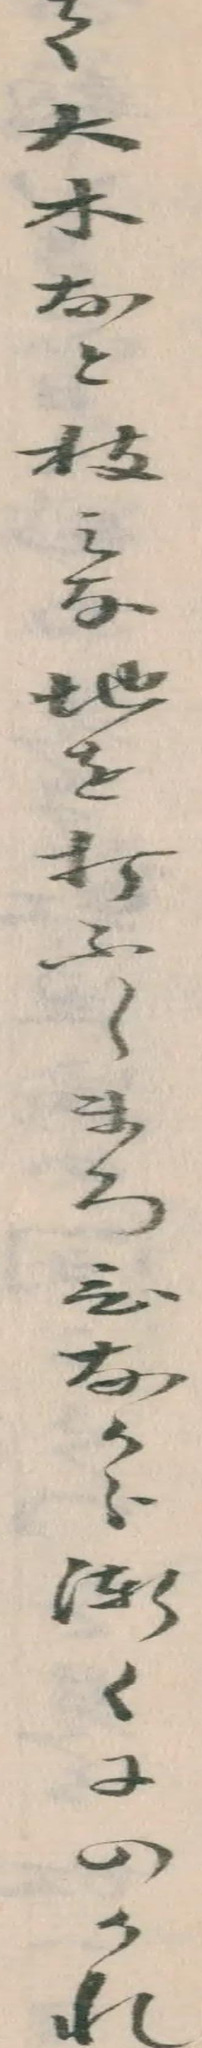て大木なと枝みな地を打ふしまろひなから漸くにのかれ
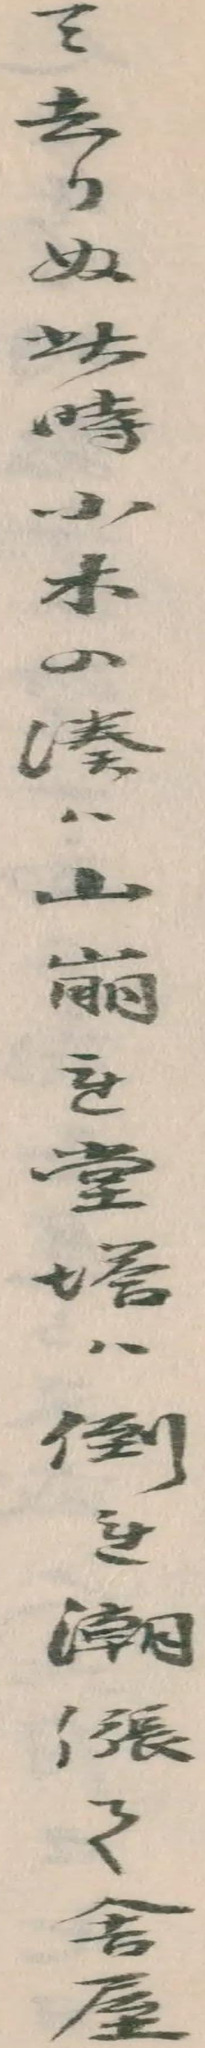て去りぬ此時小木の湊は山崩れ堂塔は倒れ潮漲て舎屋
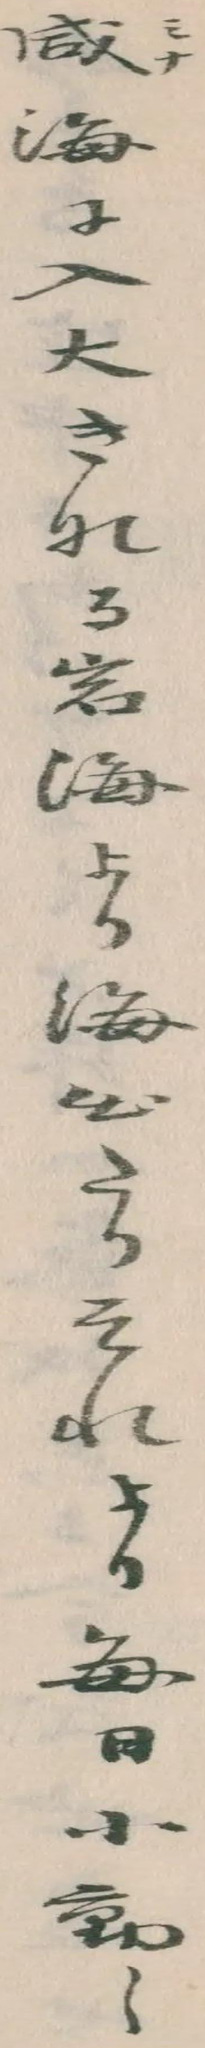咸海に入大きなる岩海より海出たりそれより毎日小動し
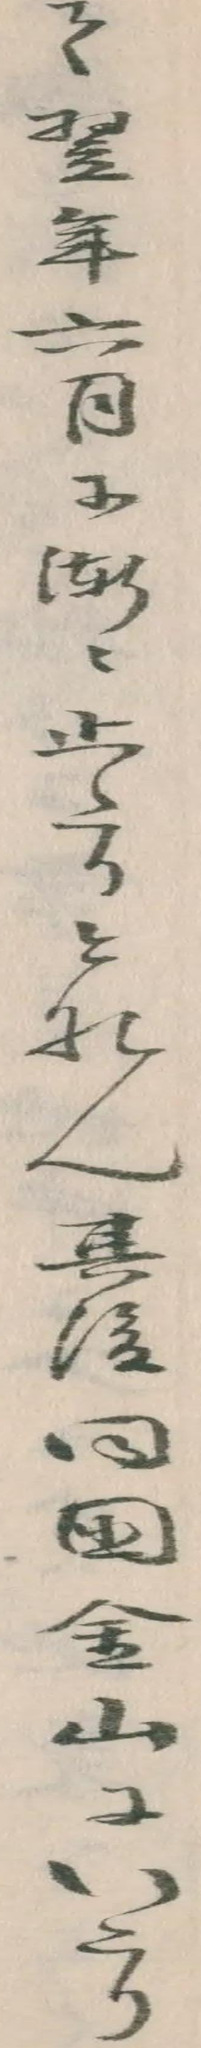て翌年六月に漸々止たりとなん其後同国金山にいたり
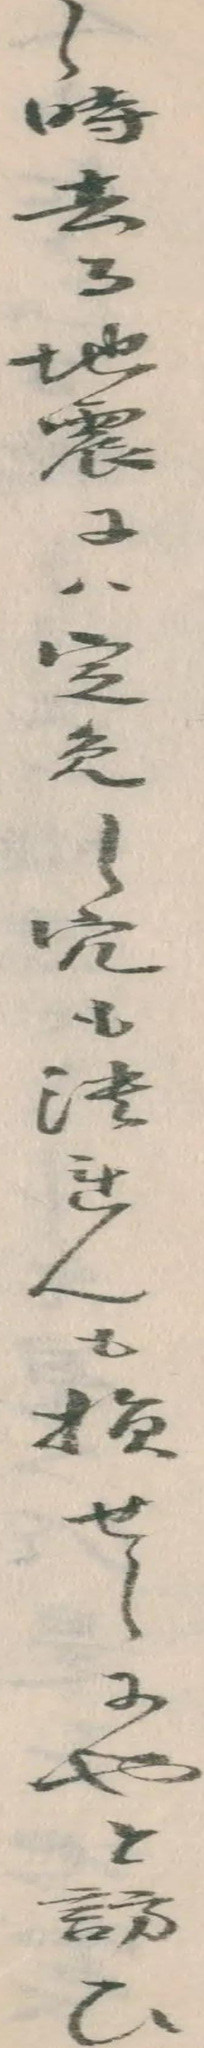し時去る地震には定めし穴も潰れ人も損せしにやと訪ひ
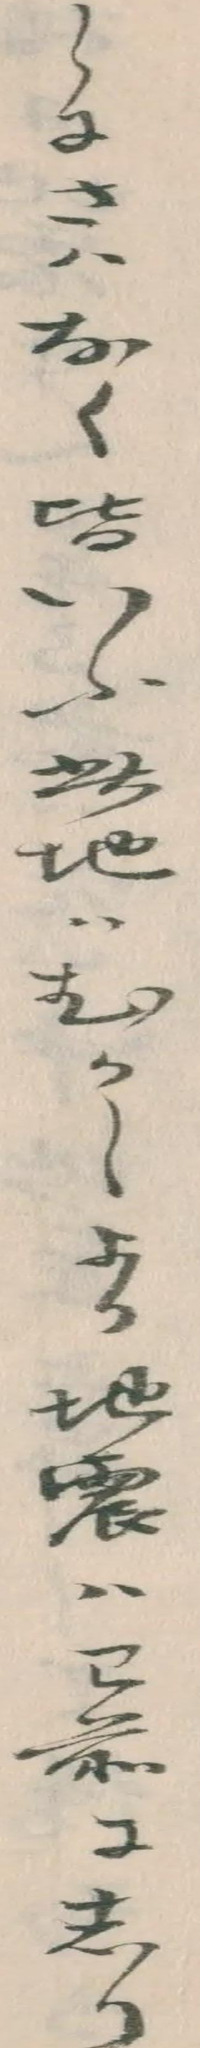しにさはなく皆いふ此地はむかしより地震は已前にしり
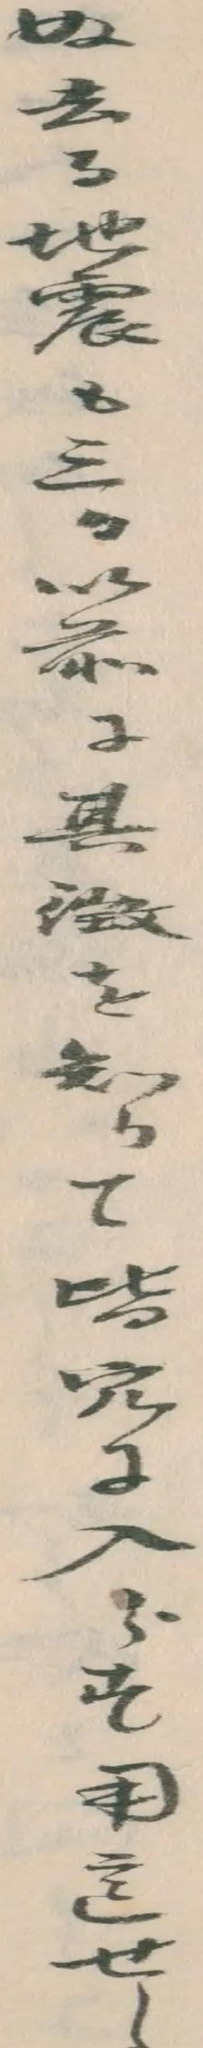ぬ去る地震も三日以前に其徴を知りて皆穴に入らす用意せし

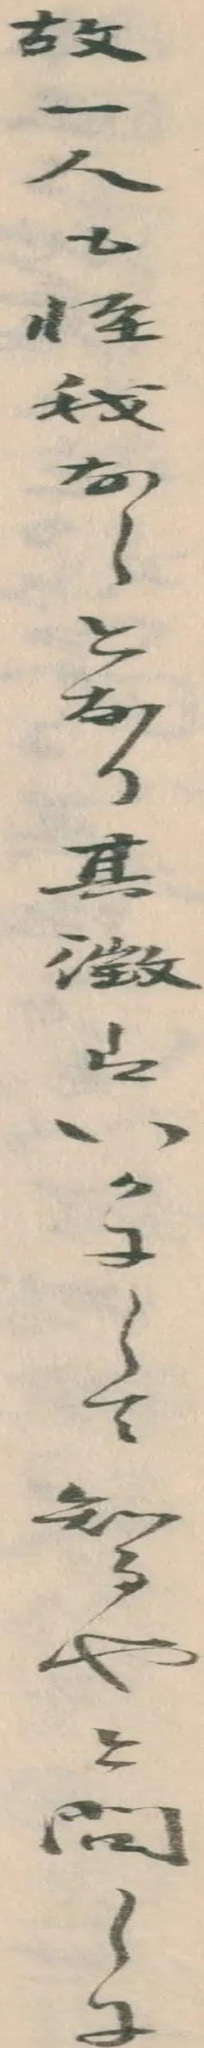故一人も怪我なしとなり其徴はいかにして知るやと問しに
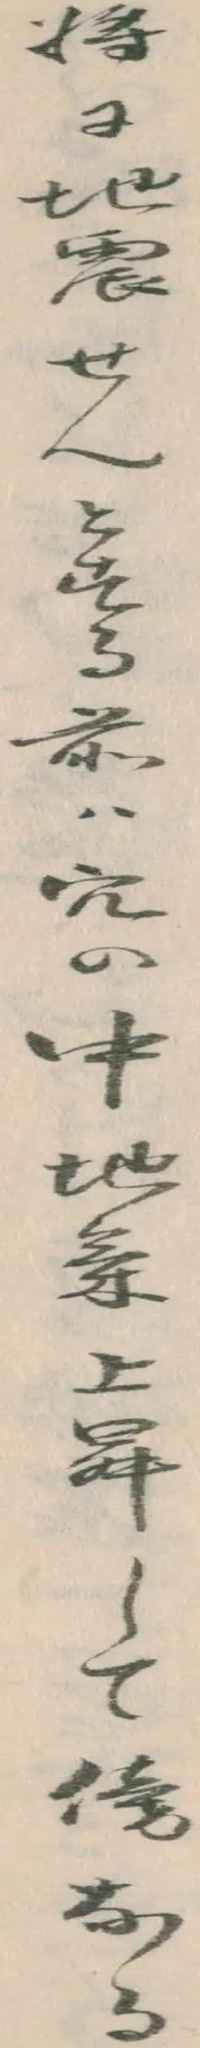将に地震せんとする前は穴の中地気上昇して傍なる
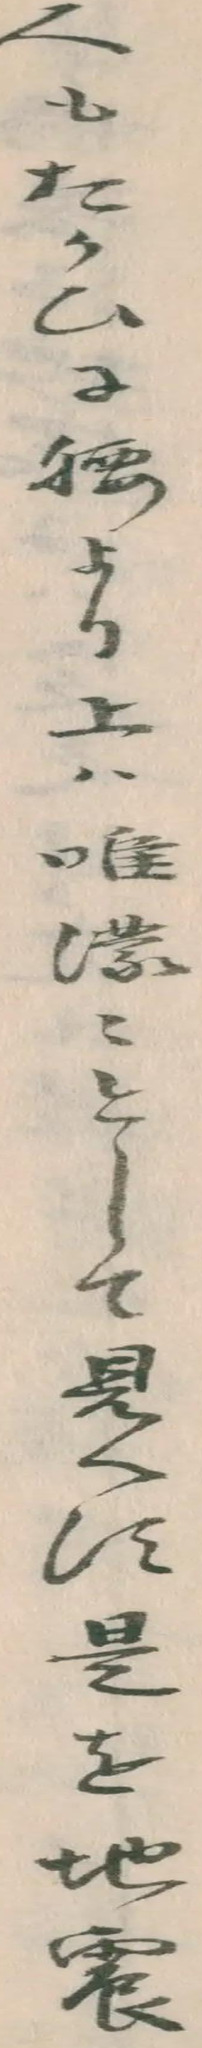人もたかひに腰より上は唯濛々として見へす是を地震
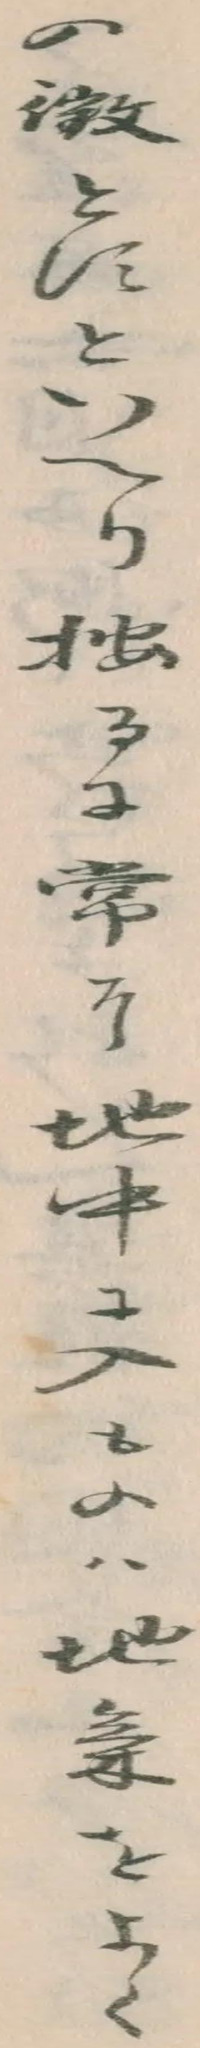の徴とすといへり按るに常に地中に入ものは地気をよく
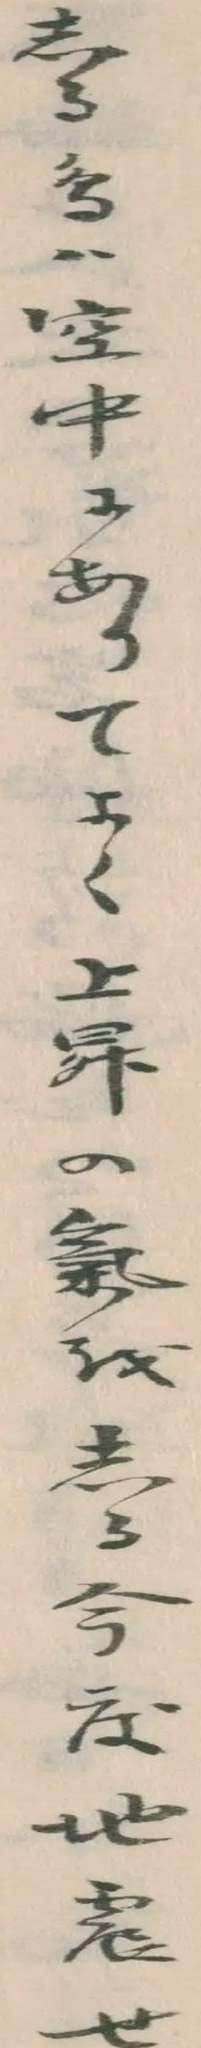しる鳥は空中にありてよく上昇の気をしる今度地震せ
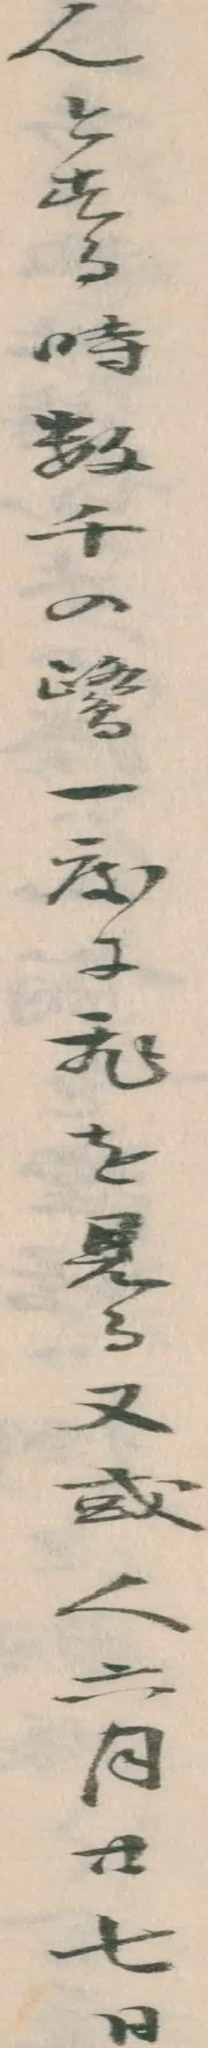んとする時数千の鷺一度に飛を見る又或人六月廿七日
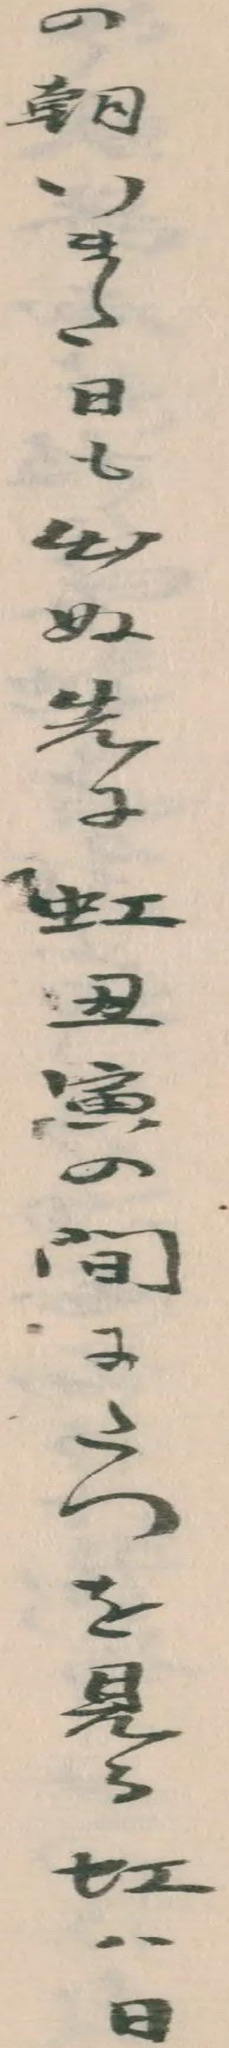の朝いまた日も出ぬ先に虹丑寅の間にたつを見る虹は日
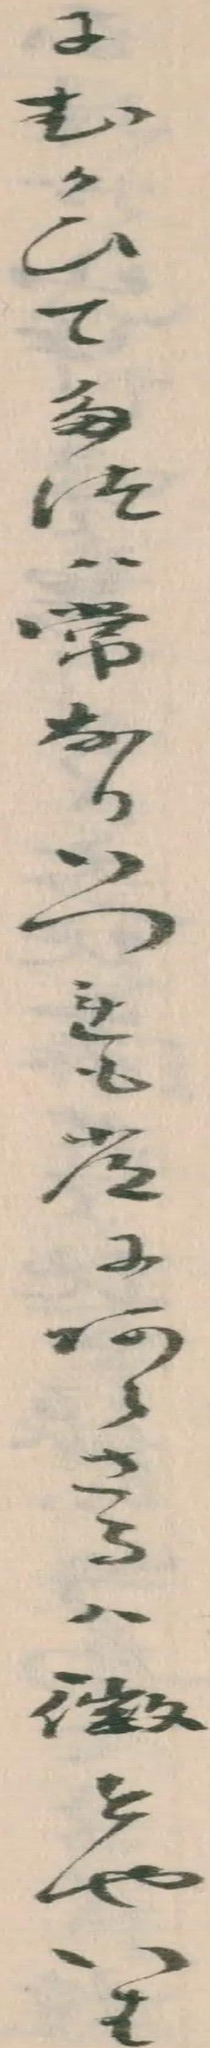にむかひてたつは常なりいつれも常にあらさるは徴とやいは
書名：地災撮要. 巻11-12(地震之部)
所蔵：国立国会図書館 National Diet Library, JAPAN
